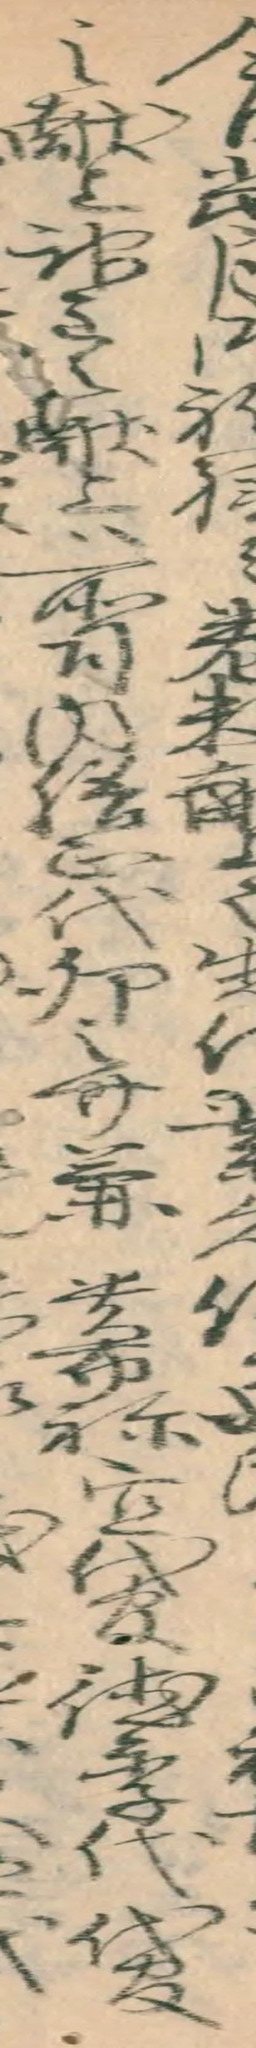之献上神主之献上ハ所司膳正代卯之介兼貴布祢宜代官徳季代代官
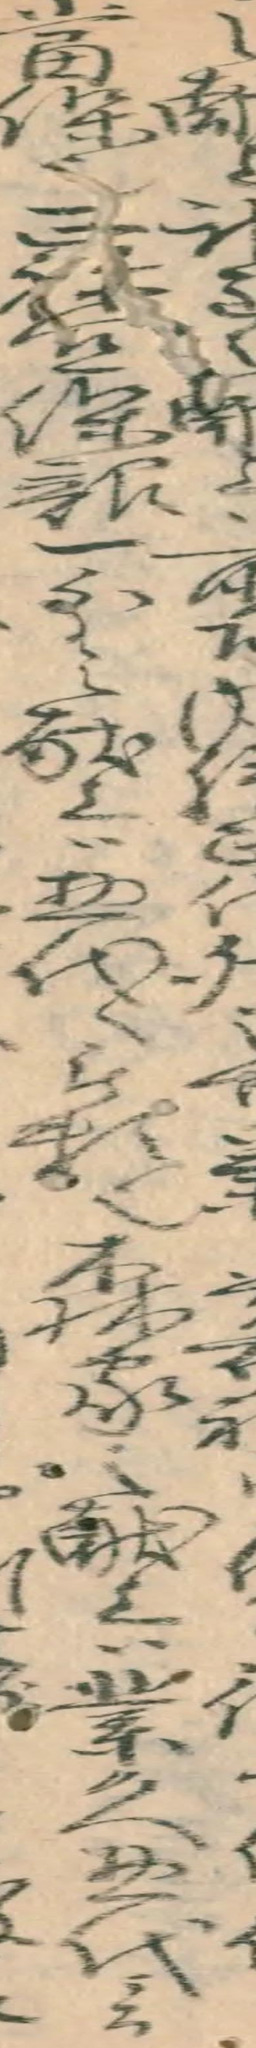当保也正祢宜保韶一分之献上ハ惣代へ被頼也森家之献上ハ業久惣代ニ而
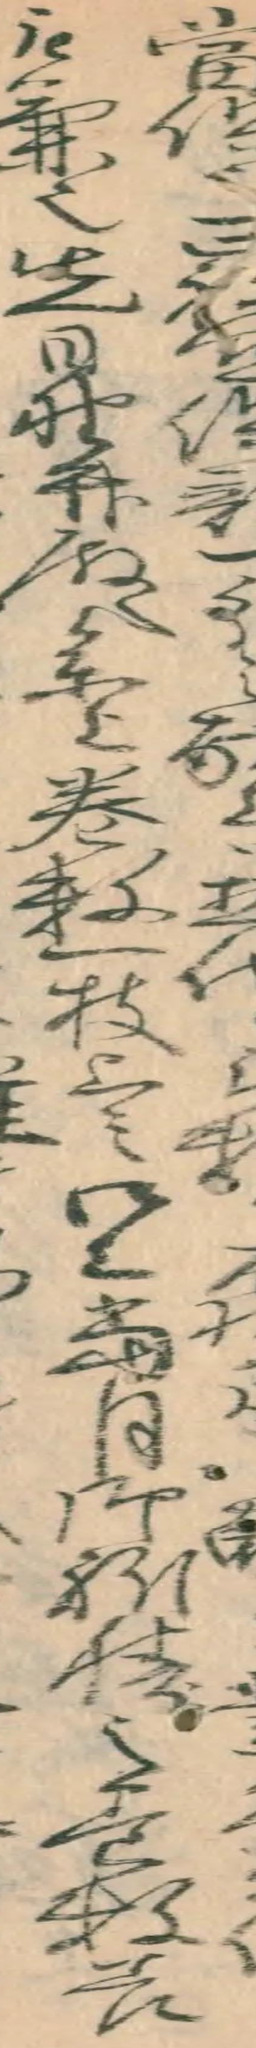被兼也先日野弁殿へ参上巻数一枝上之口上当月御祈祷之巻数差
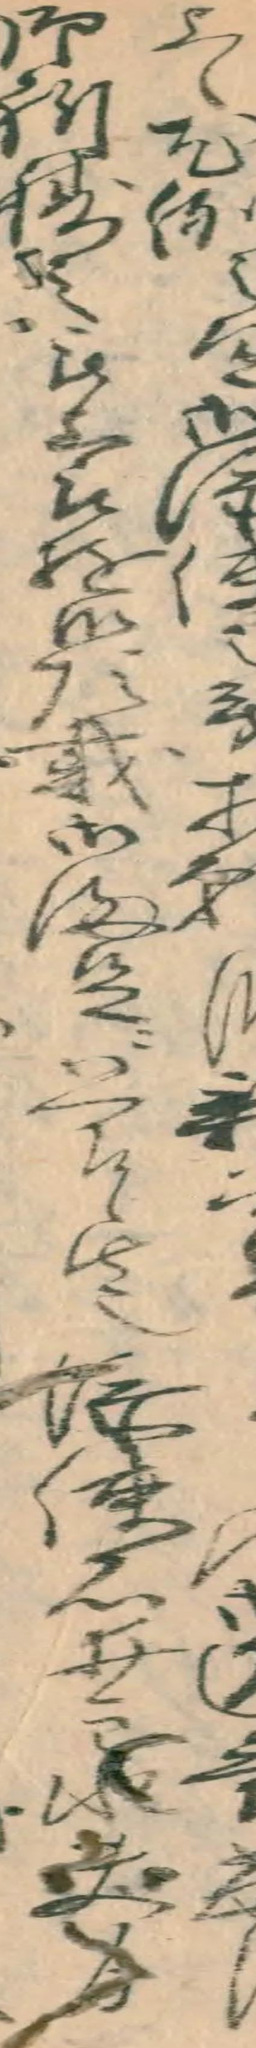御祈祷之被上被遊御頂戴御満足ニ思召候由也添使石井主水夫ゟ
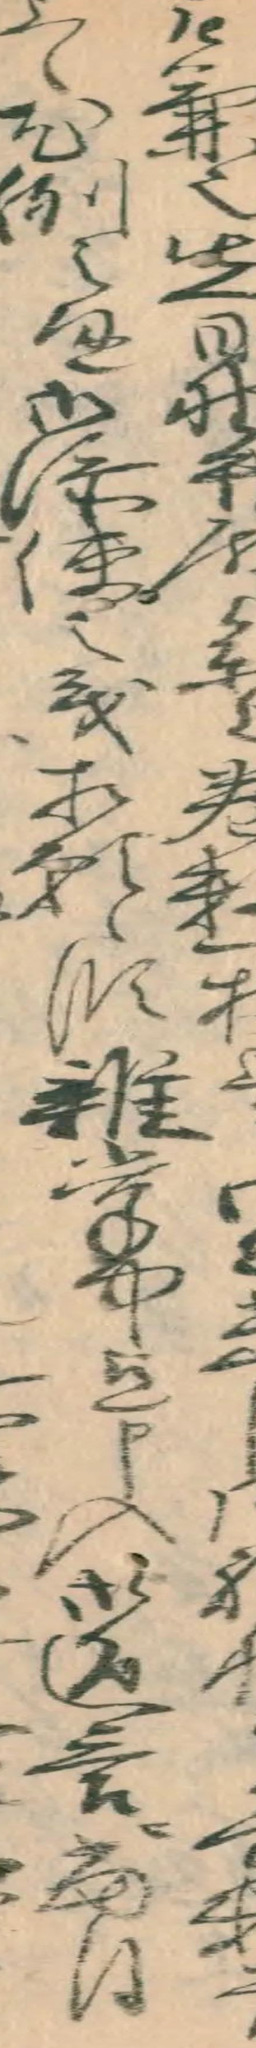上候尤例之通御添使之義相願候段雑掌中迄申入御返答ニ当月
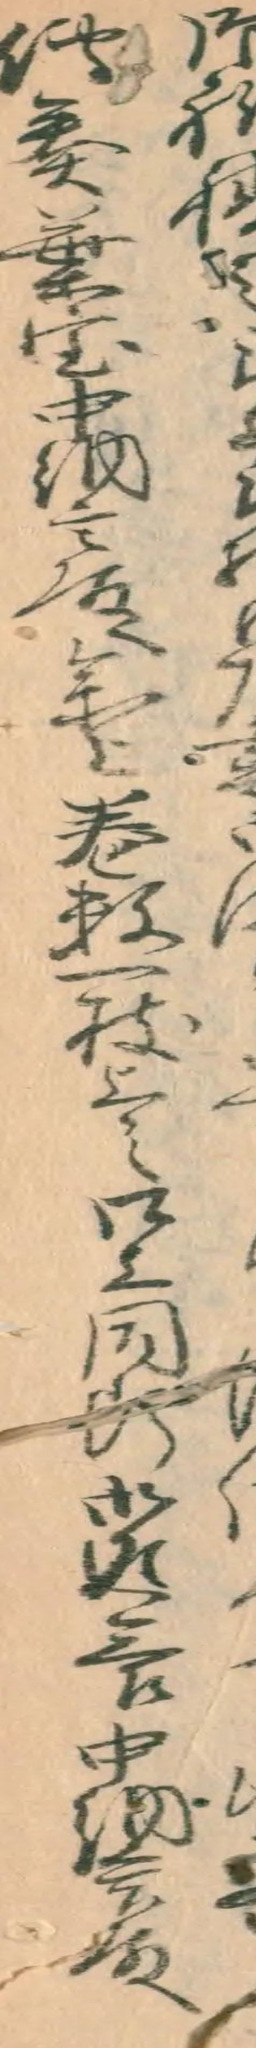伝奏葉室中納言殿へ参上巻数一枝上之口上同断御返答中納言殿
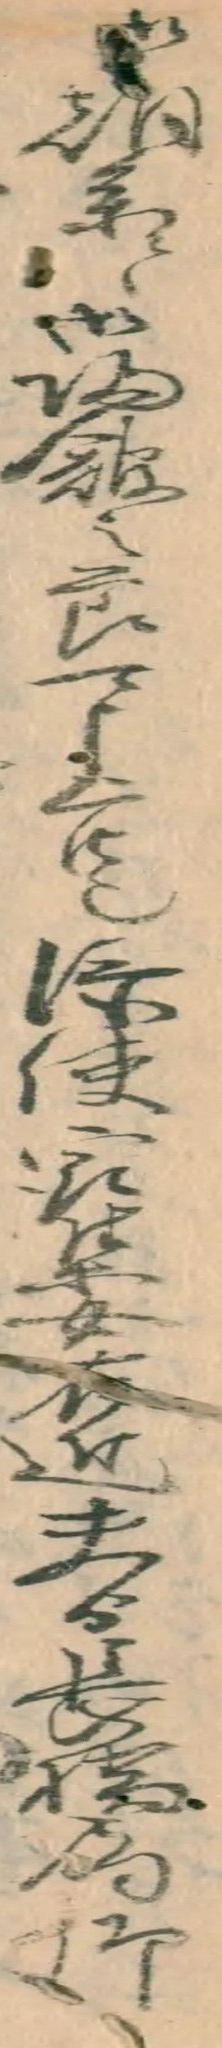御朝参ニ候御帰館之節可申上由也添使最集女右近夫ゟ長橋局御
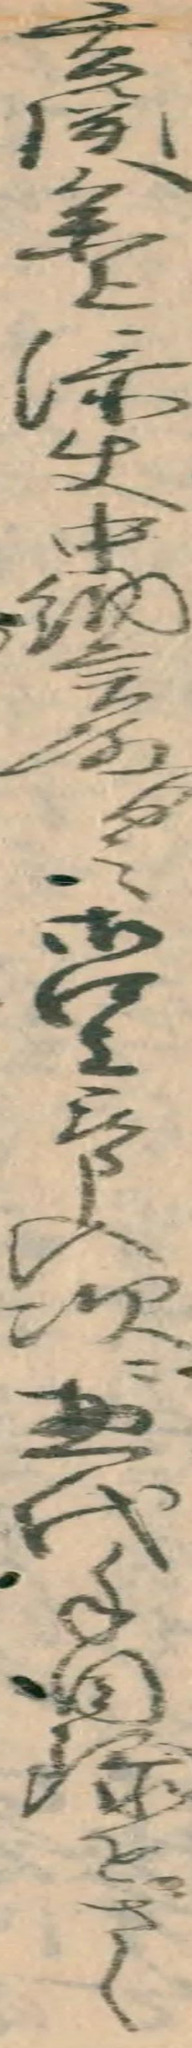玄関へ参上添使中納言殿ゟ之御口上被申入次ニ惣代手目録をさし
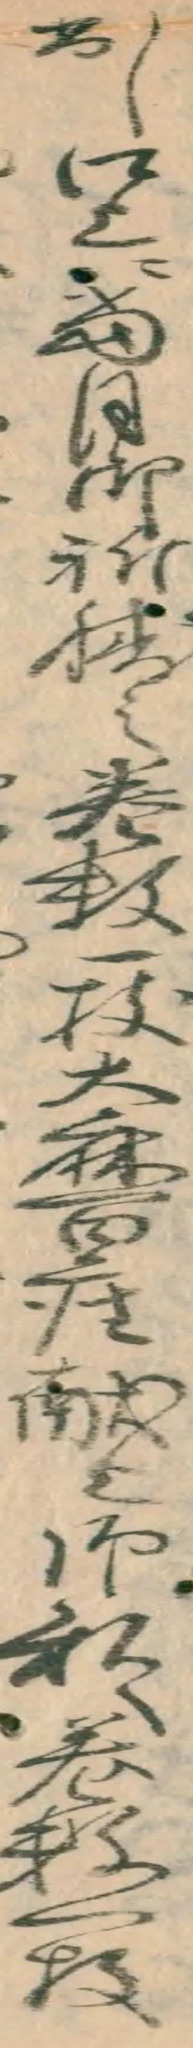出し口上ニ当月御祈祷之巻数一枝大麻百座献上御私へ巻数一枝
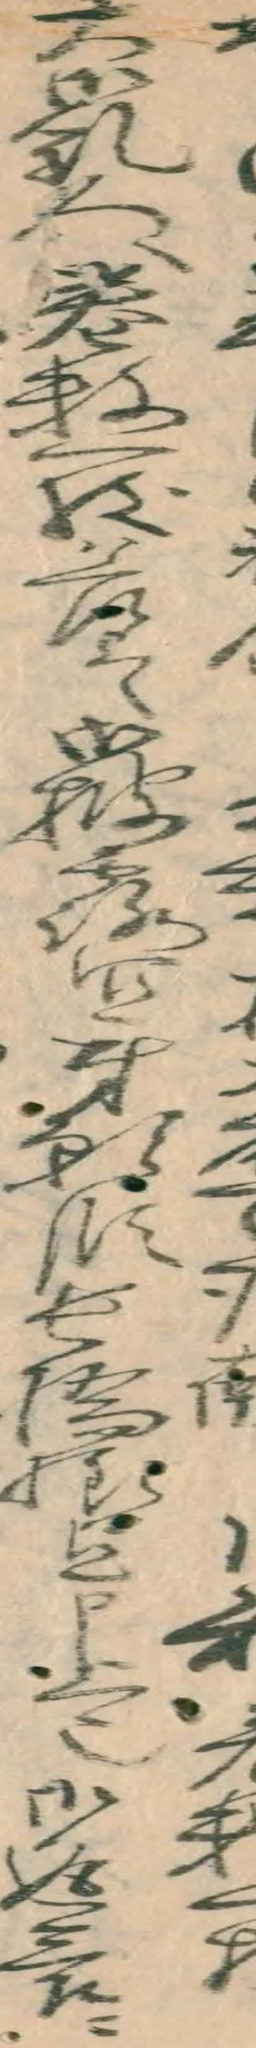大御乳人へ巻数一枝差上候御披露宜奉願段長橋様迄申上也御返答ニ
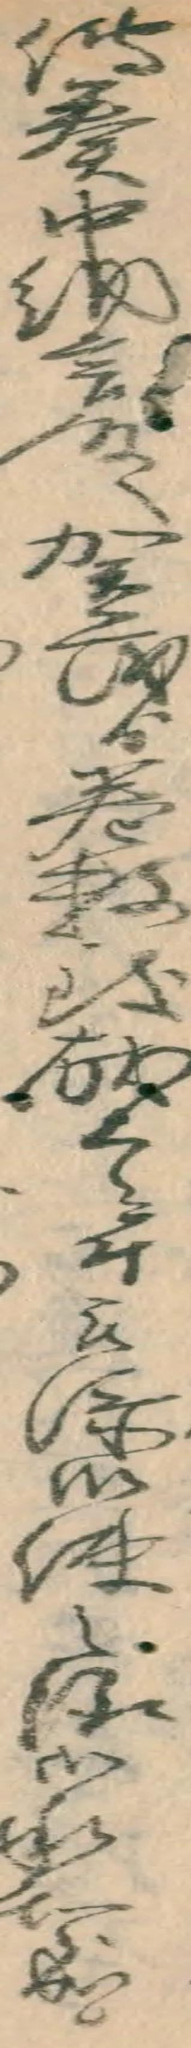伝奏中納言殿へ賀茂ゟ巻数致献上候ニ付被添御使之趣御承知被成候
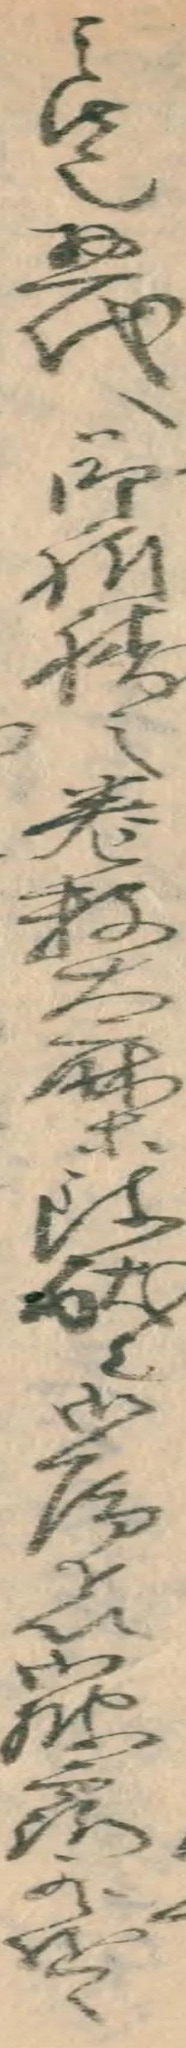之由也惣代へハ御祈祷之巻数大麻等致献上御序を以御披露可被遊候
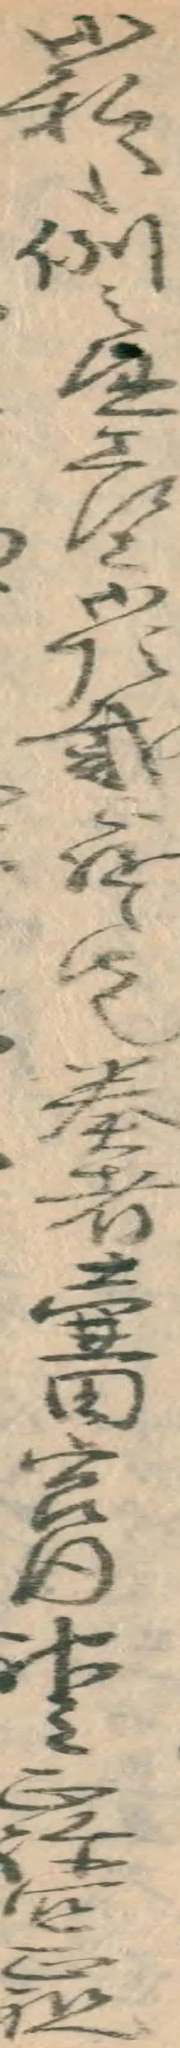御私へも例之通差上御頂戴被遊候由也奏者壺田宮内神主正祢宜正祝
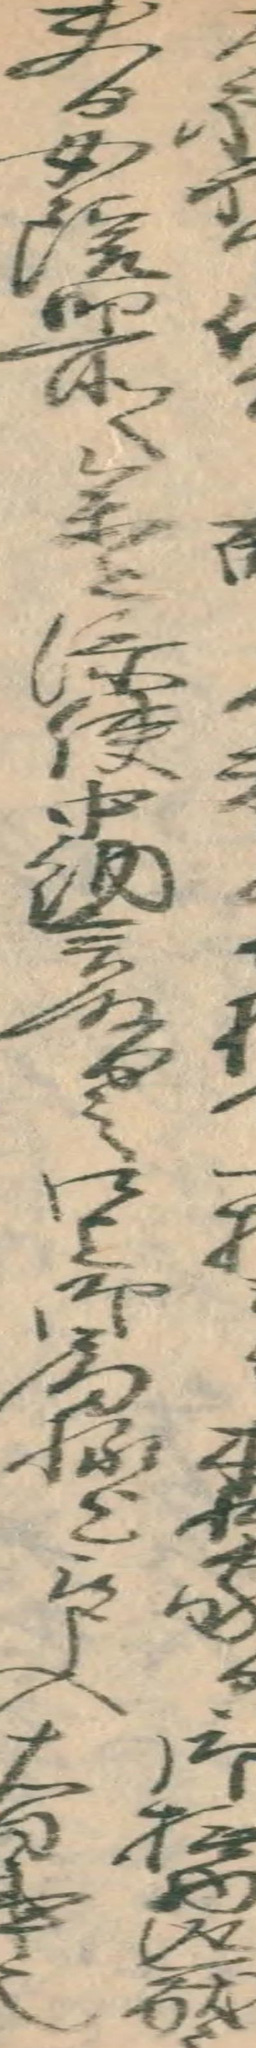夫ゟ女院御所へ参上添使中納言殿ゟ之口上御局様迄被申入右同事也
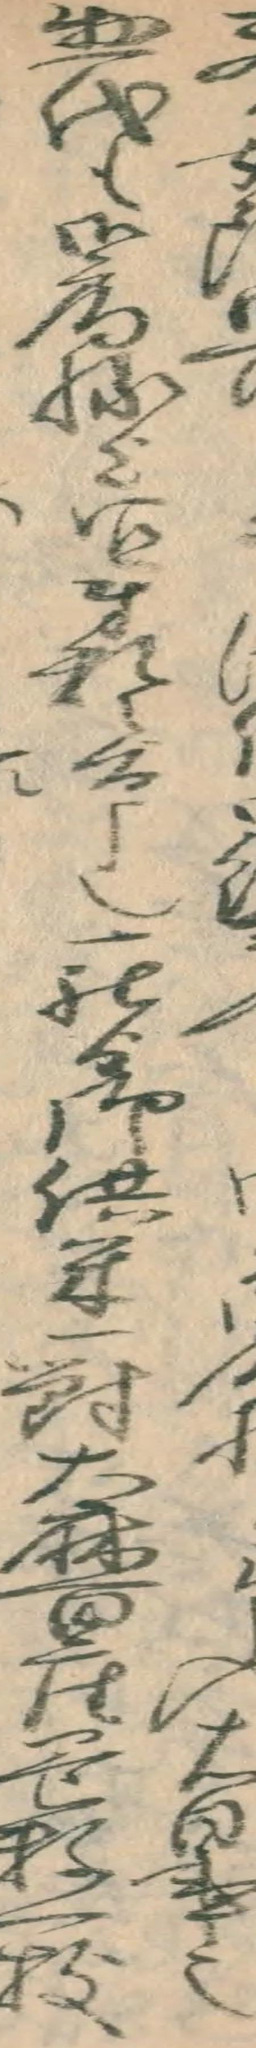惣代も御局様迄宜奉願候旨申也一社ゟ御供米一対大麻百座巻数一枝
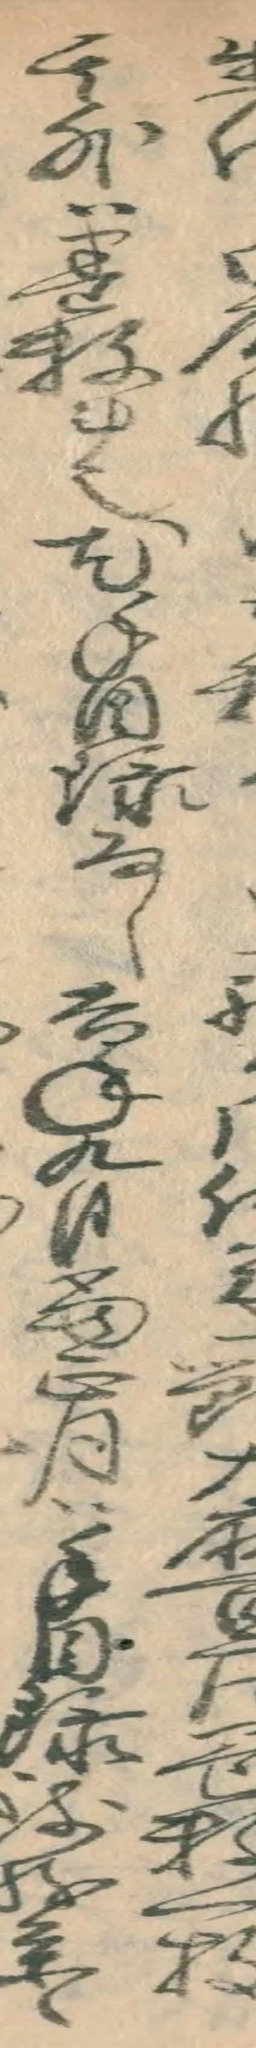其外ハ巻数計也尤手目録なし去年九月当正月ハ手目録致持参候
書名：賀茂社記録. 第58冊
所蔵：国立国会図書館 National Diet Library, JAPAN
